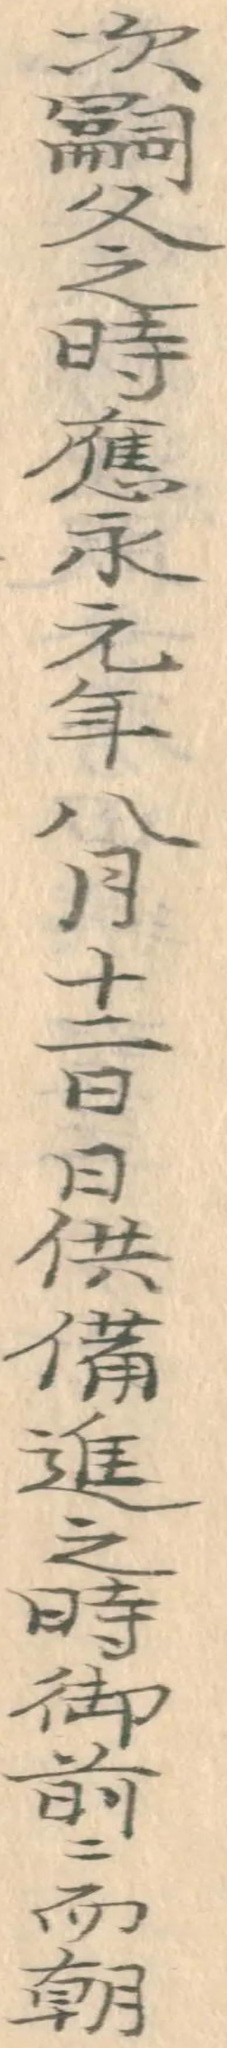次嗣久之時応永元年八月十二日日供備進之時御前ニ而朝
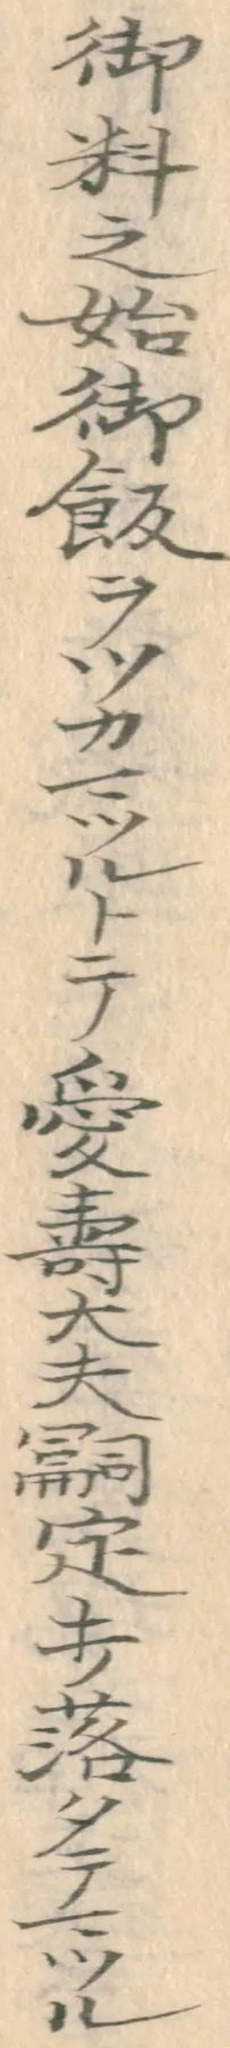御料之始御飯ヲツカマツルトテ愛寿大夫嗣定打落タテマツル
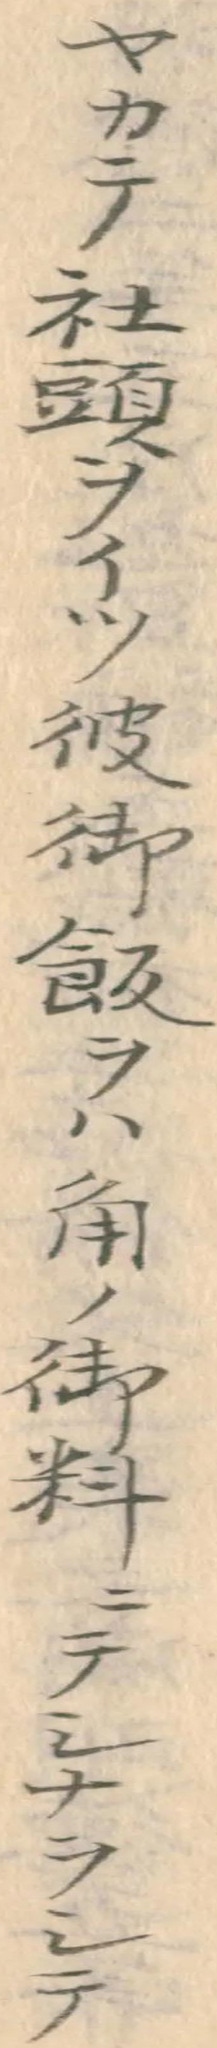ヤカテ社頭ヲイツ彼御飯ヲハ角ノ御料ニテシナラシテ
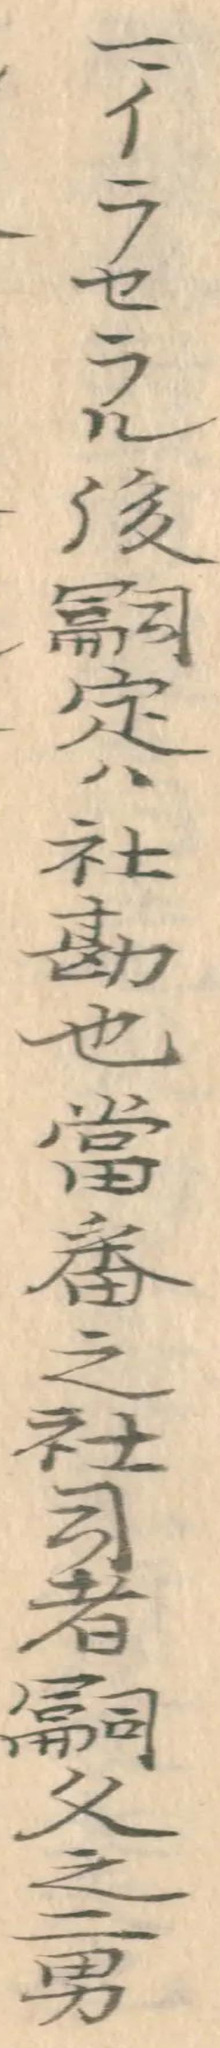マイラセラル後嗣定ハ社勘也当番之社司者嗣久之二男
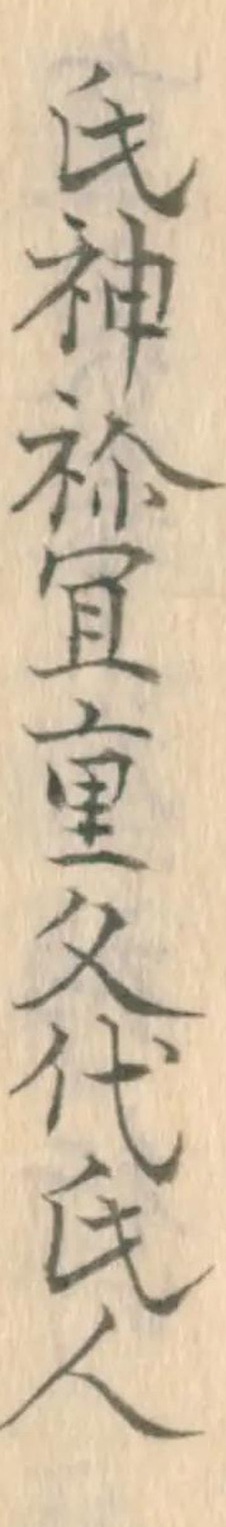氏神祢宜重久代氏人
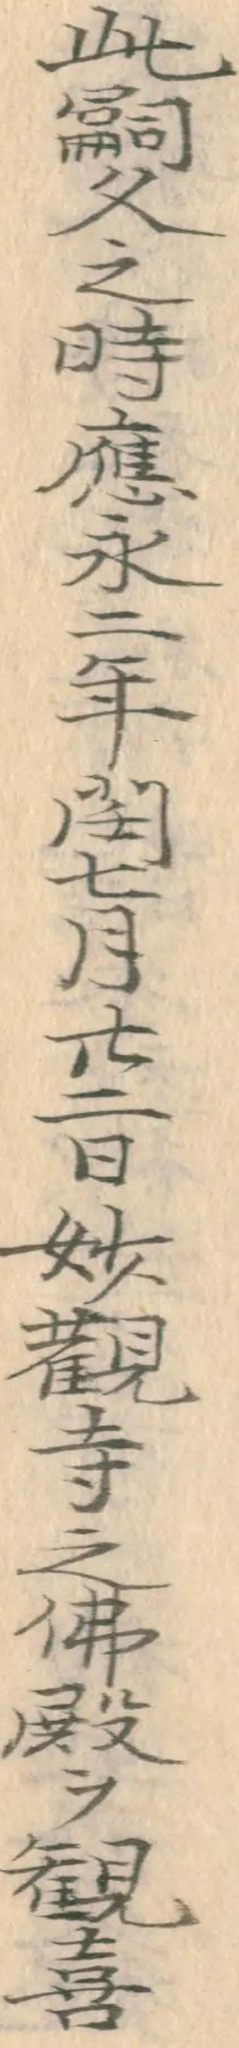此嗣久之時応永二年閏七月廿二日妙観寺之仏殿ヲ観喜
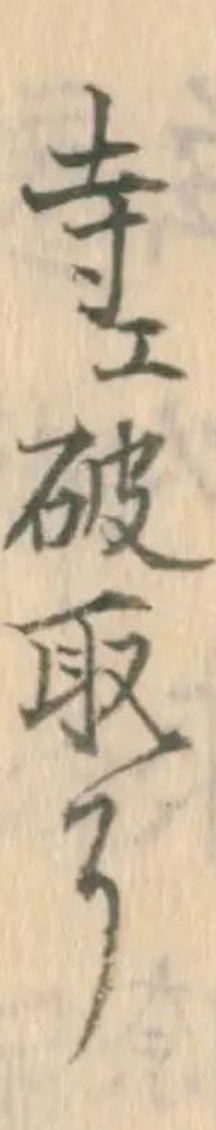寺エ破取了
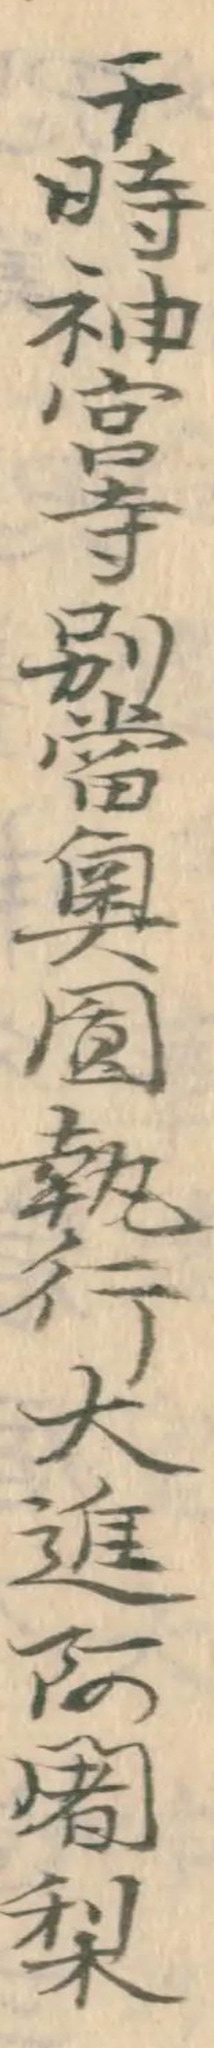于時神宮寺別当奥円執行大進阿闍梨
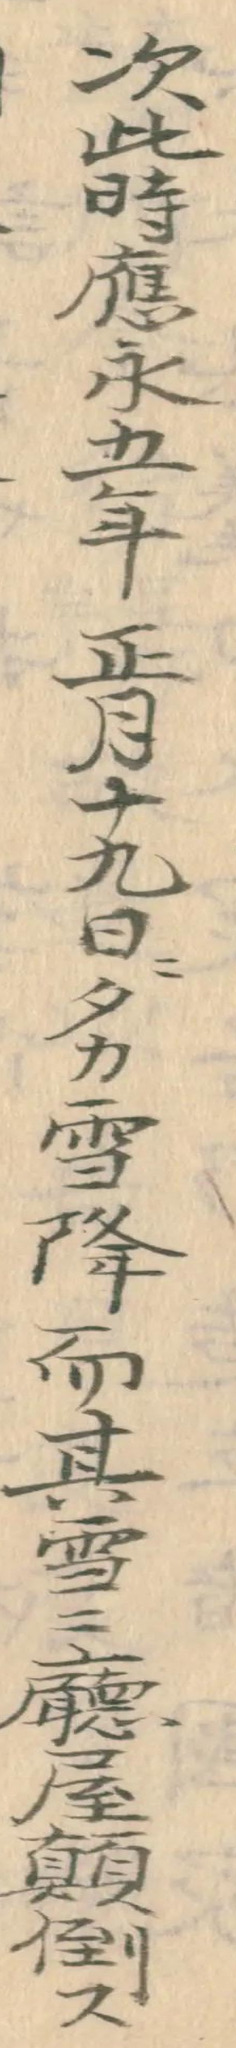次此時応永五年正月十九日ニ夕カ雪降而其雪ニ庁屋顛倒ス
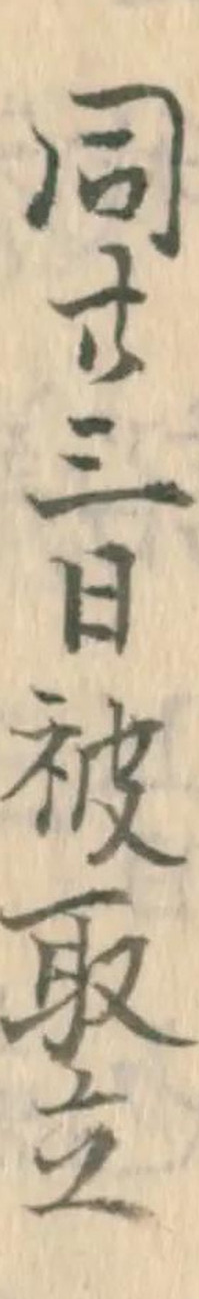同廿三日被取立
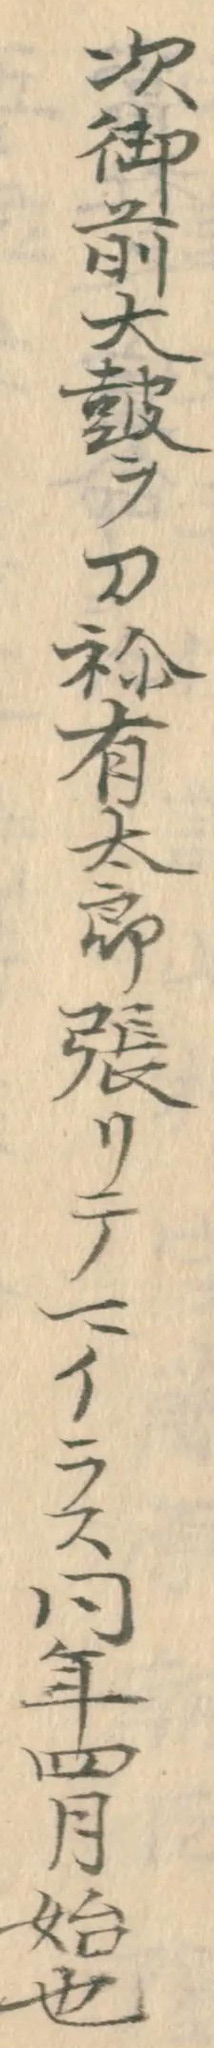次御前大鼓ヲ刀祢有太郎張リテマイラス同年四月始也
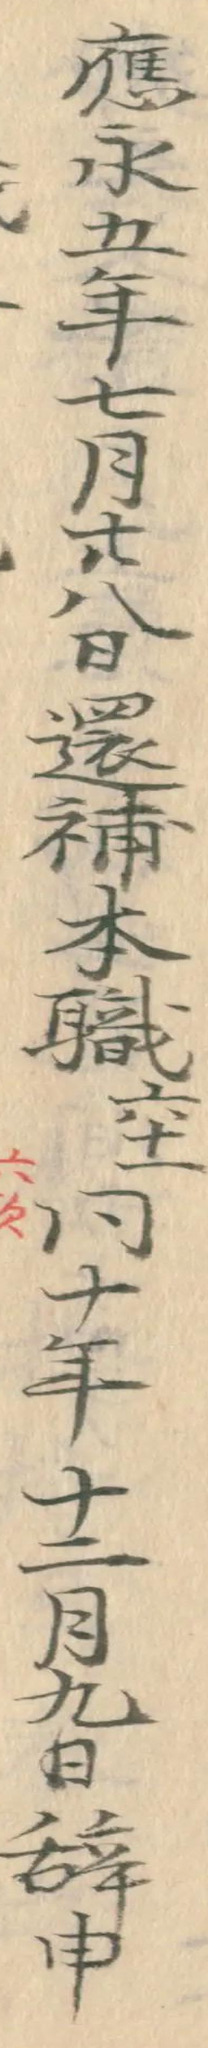応永五年七月廿八日還補本職六十一同十年十二月九日辞申
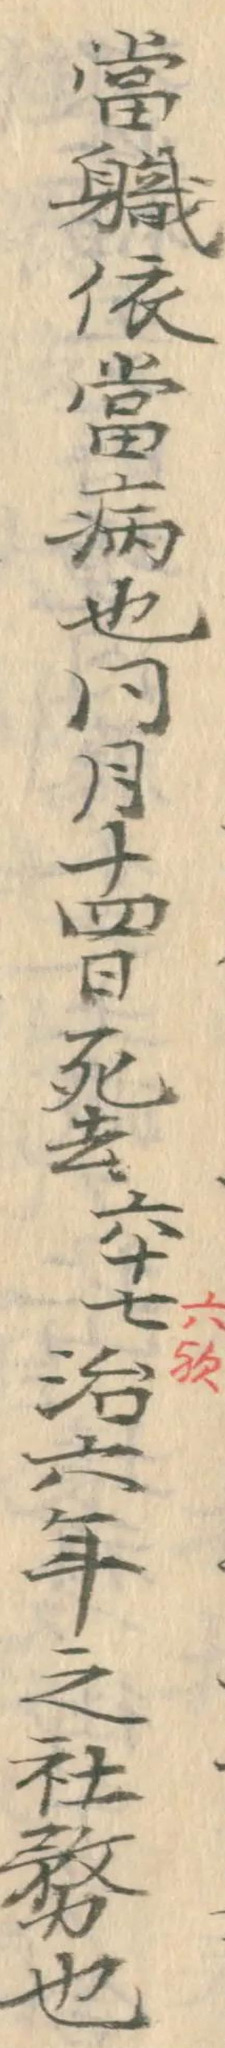当職依当病也同月十四日死去六十七治六年之社務也
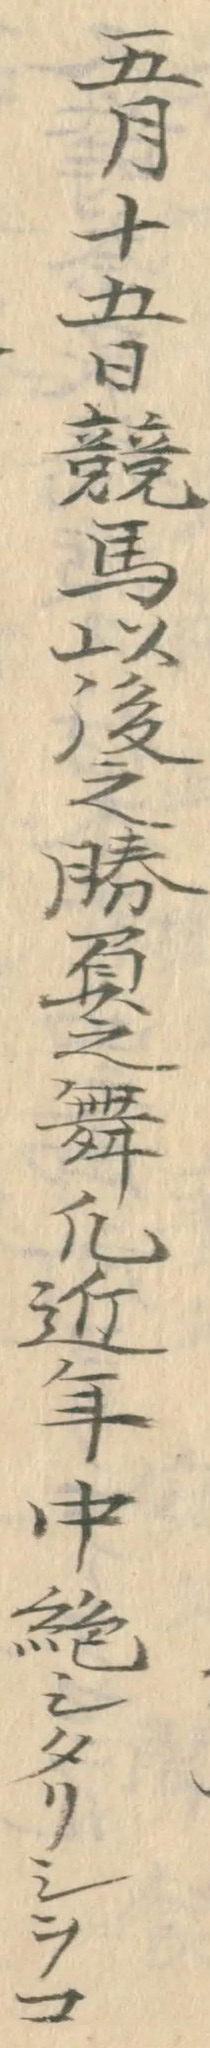五月十五日競馬以後之勝負之舞凡近年中絶シタリシヲコ
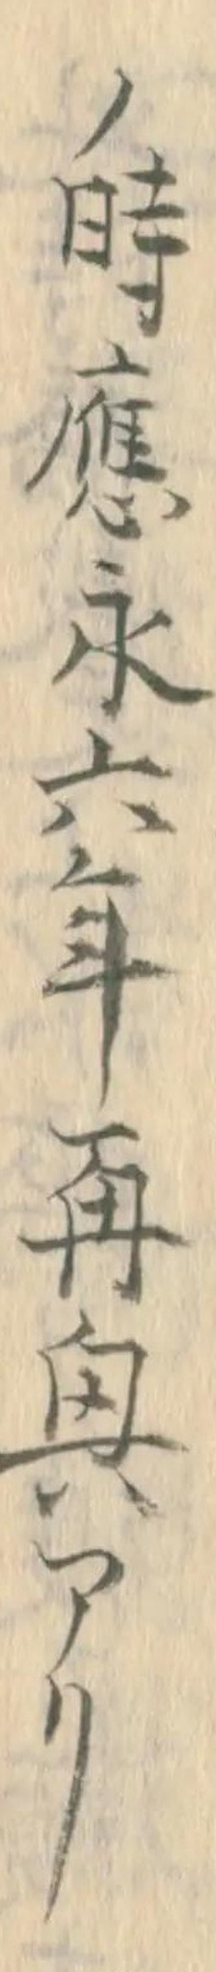ノ時応永六年再興アリ
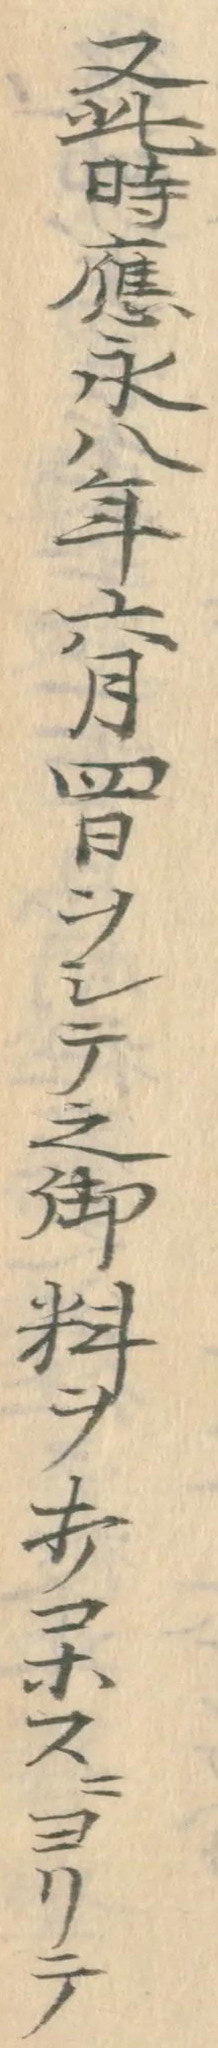又此時応永八年六月四日ヲシテ之御料ヲ打コホスニヨリテ
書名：賀茂社記録. 第24冊
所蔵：国立国会図書館 National Diet Library, JAPAN
